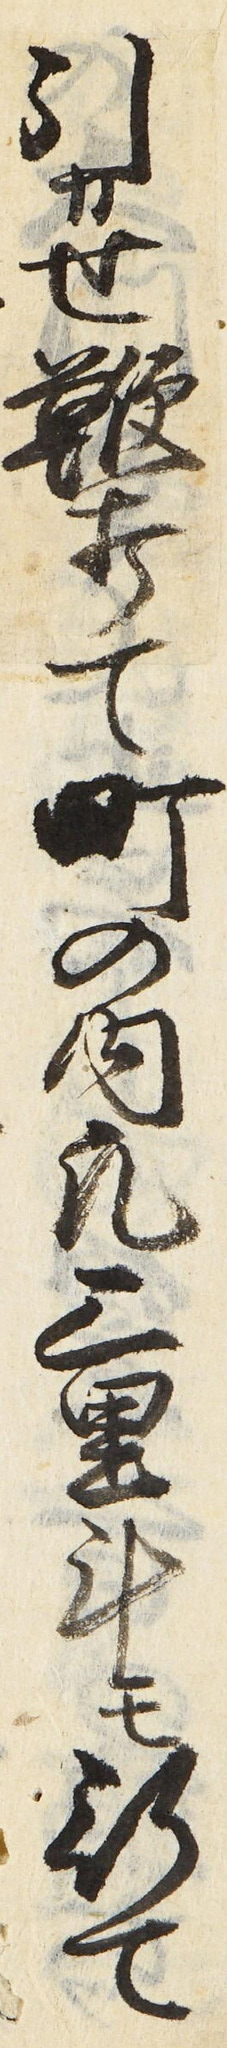引かせ鞭打て町の内凡三里計も行て
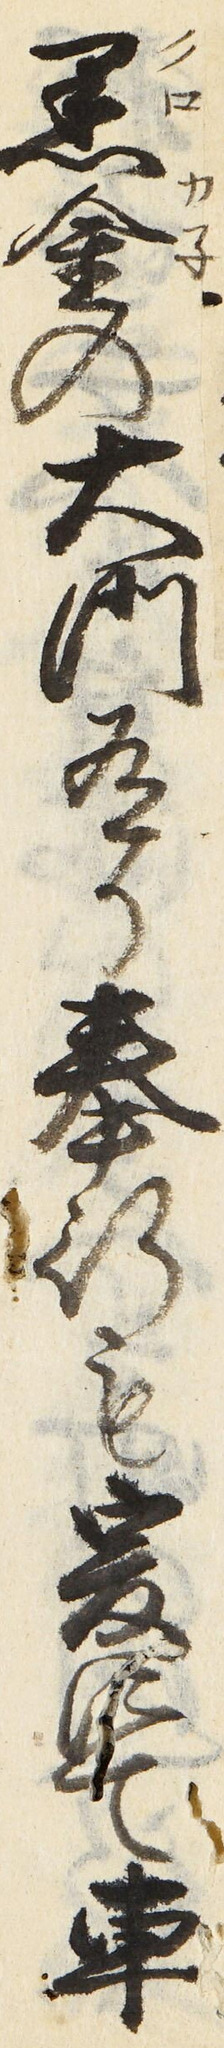黒金の大門有り奉行も爰にて車
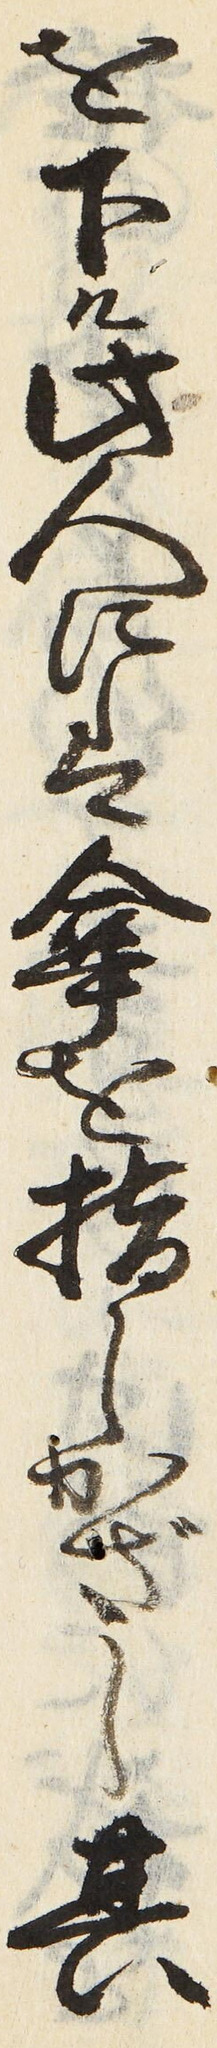を下る此人には傘を指しかざし其
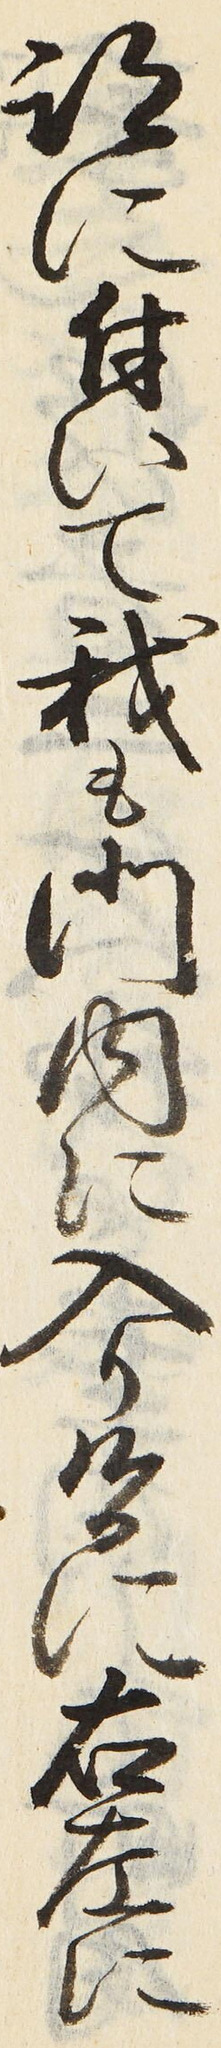跡に付いて我も門内に入りけるに右左に
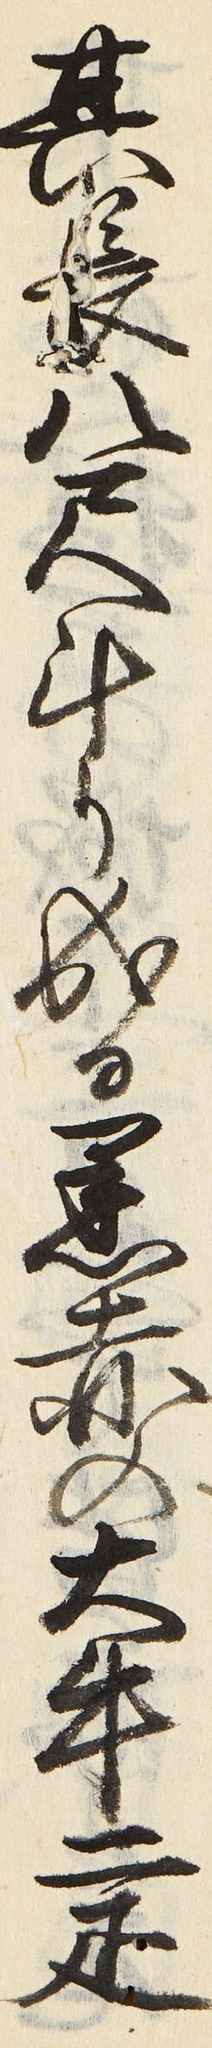其長八尺計り成る黒赤の大牛二疋
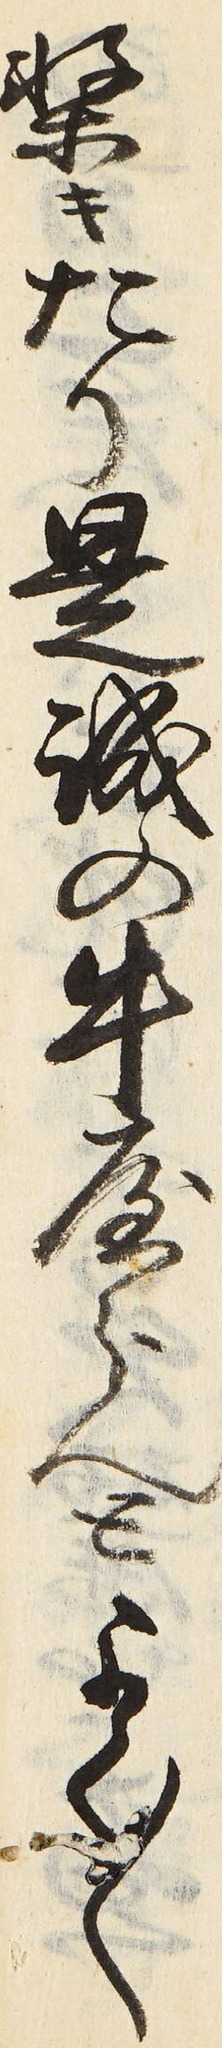繋きたり是誠の牛やらんとよく〳〵
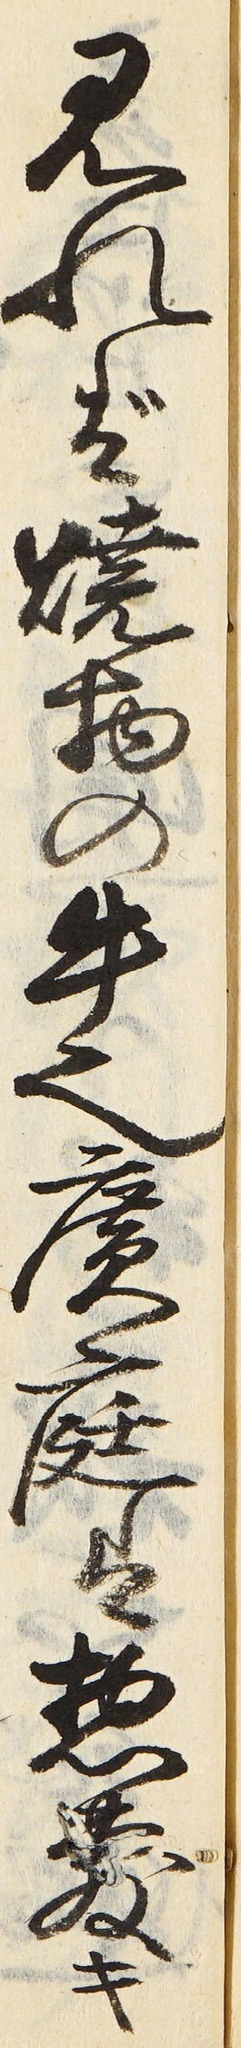見れば焼物の牛也広庭は惣敷き
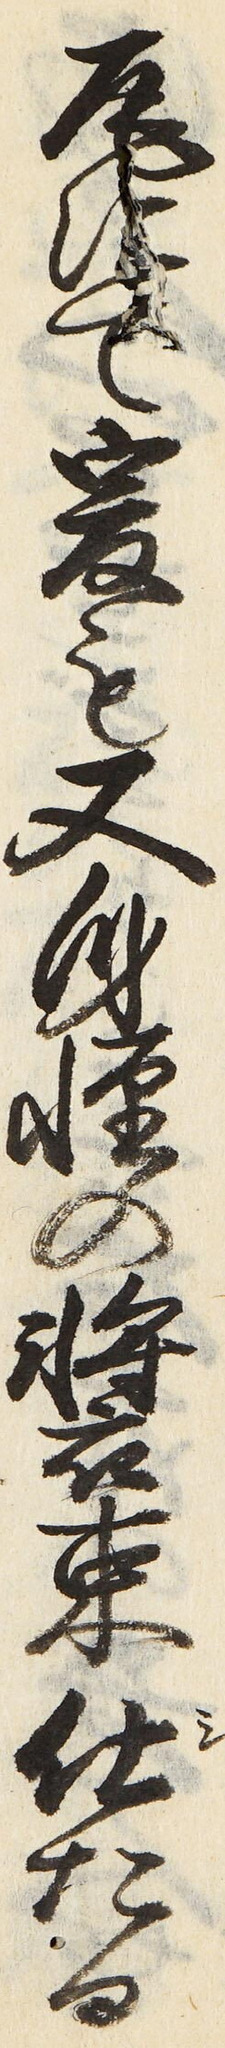瓦にて爰も又身軽の装束仕たる
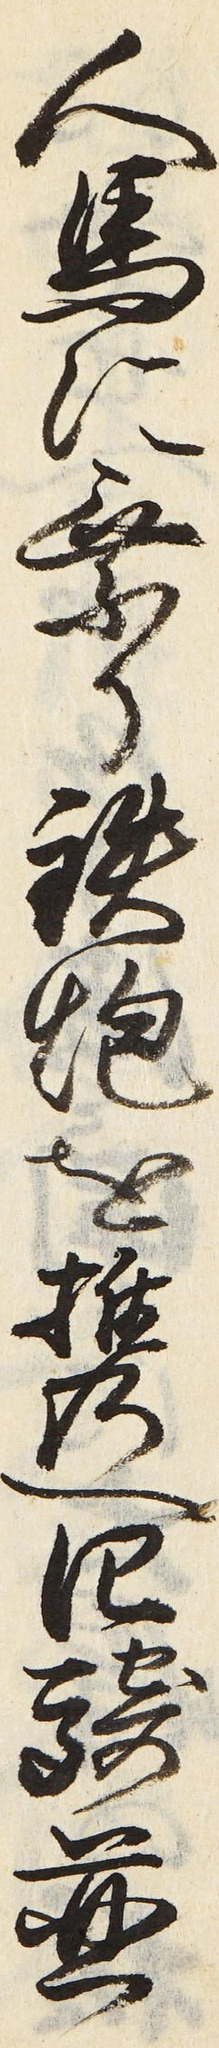人馬に乗り鉄砲を携へ四騎並
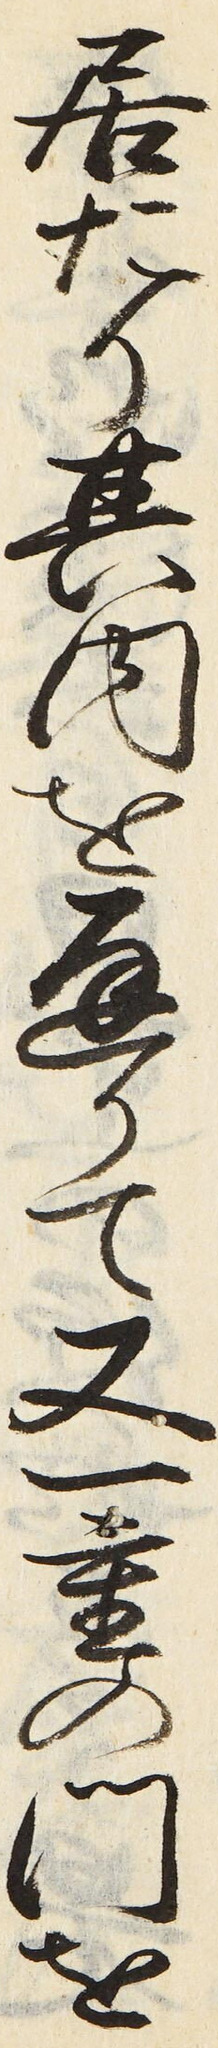居たり其内を通りて又一重の門を
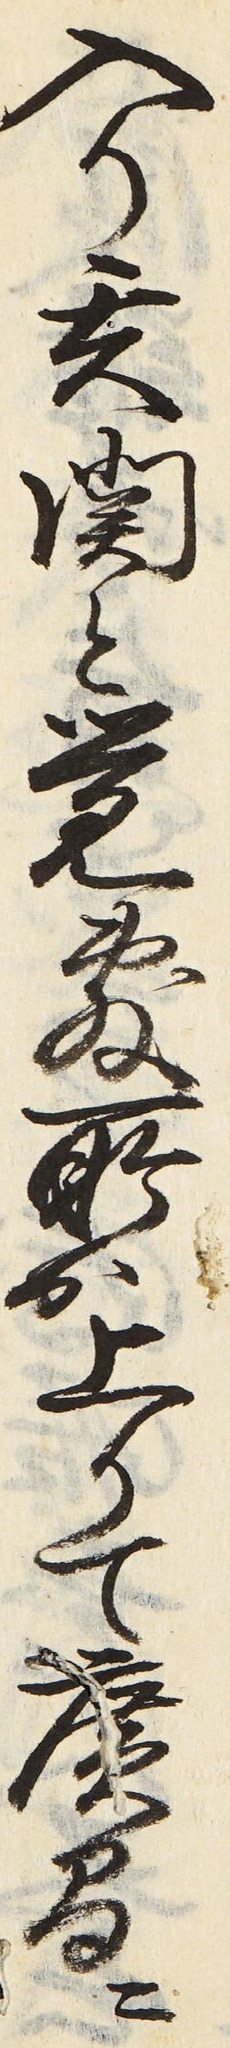入り玄関と覚敷所ゟ上りて広間に
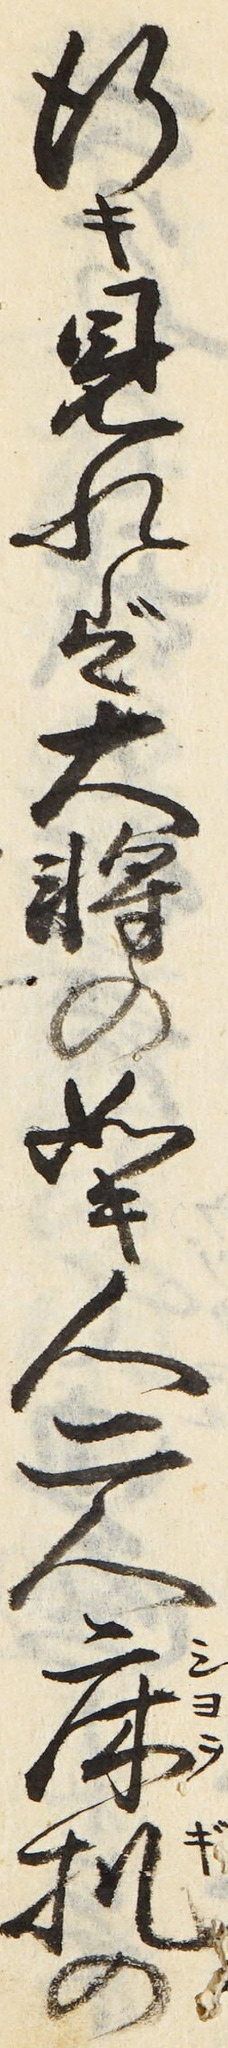行き見れば大将の如き人二人床机の
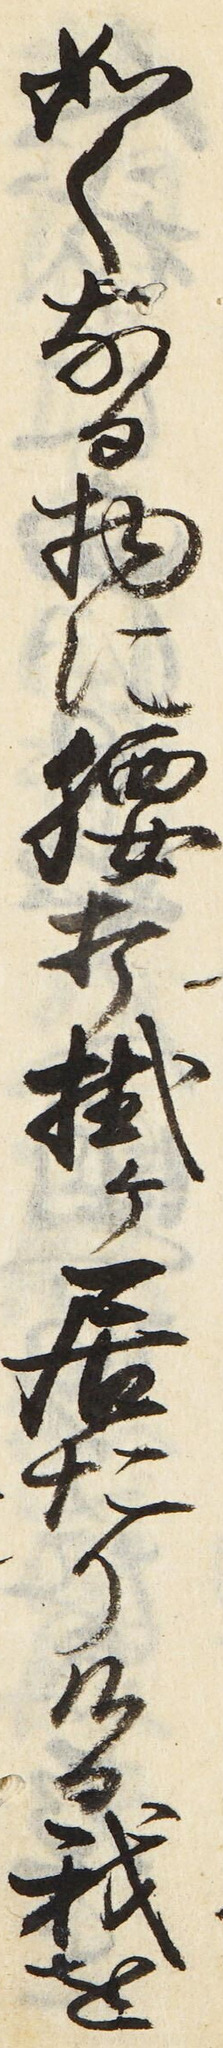如くなる物に腰打掛け居たりける我を
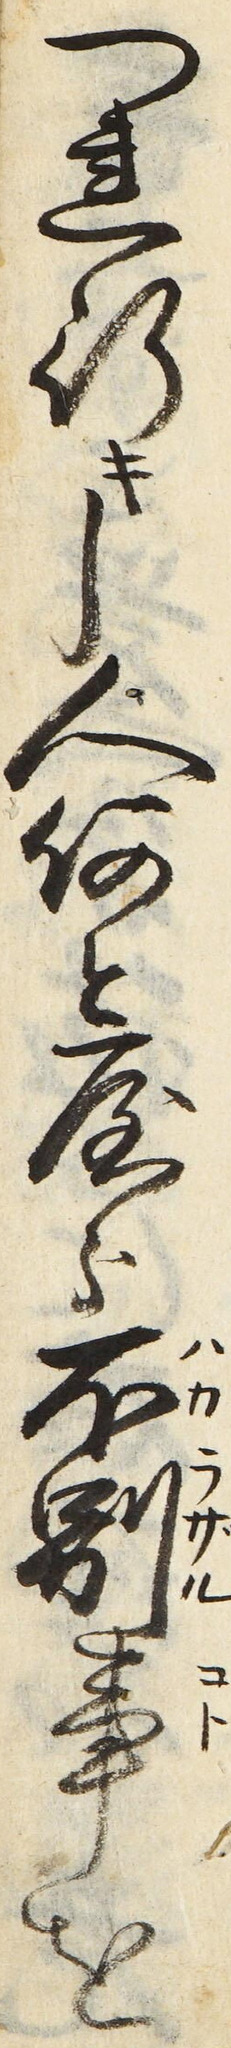つれ行きし人何とやら不別事を

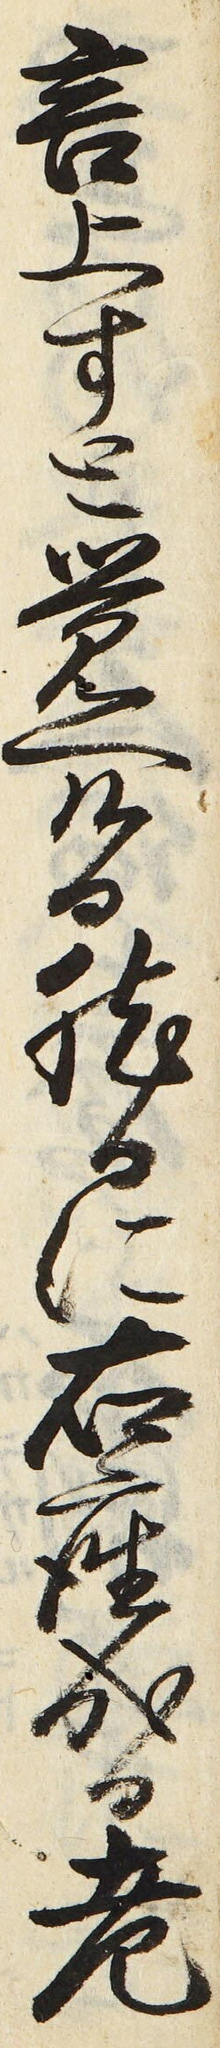言上すと覚へける然るに右座成る老
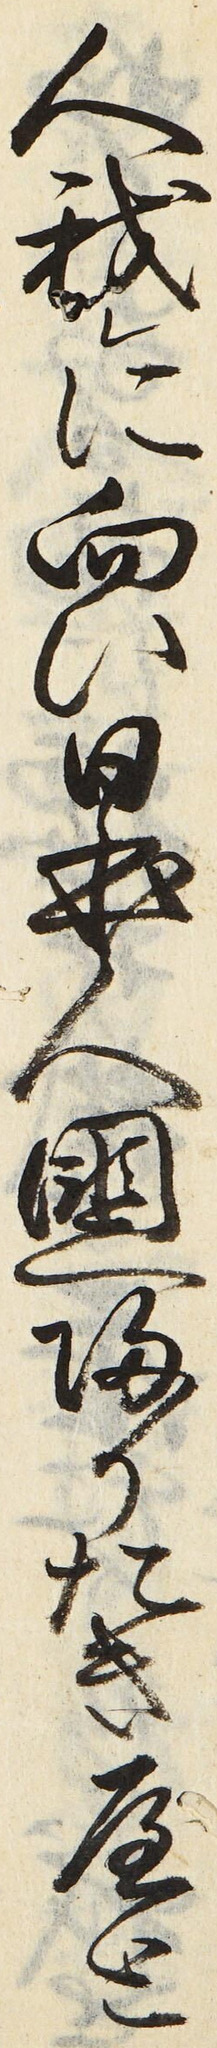人我れに向ひ日本人国へ帰りたきやと
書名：華夷九年録
